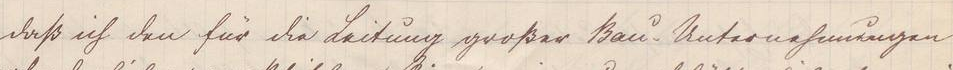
daß ich den für die Leitung großer Bau-Unternehmungen
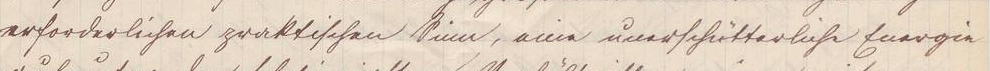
erforderlichen praktischen Sinn, eine unerschütterliche Energie
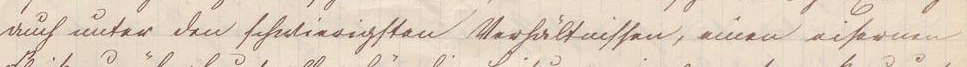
auch unter den schwierigsten Verhältnissen, einen eisernen
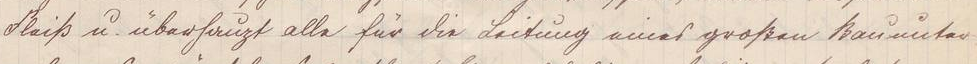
Fleiß u. überhaupt alle für die Leitung eines großen Bauunter-
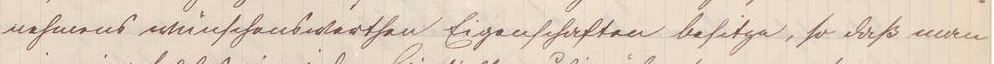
nehmens wünschenswerthen Eigenschaften besitze, so daß man
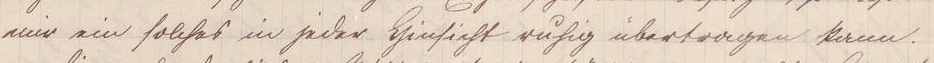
mir ein solches in jeder Hinsicht ruhig übertragen kann.
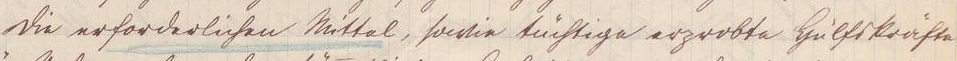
Die erforderlichen Mittel, sowie tüchtige erprobte Hülfskräfte
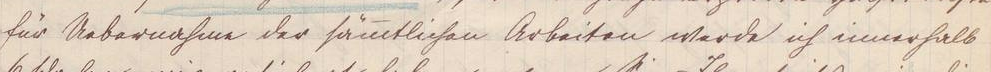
für Uebernahme der sämmtlichen Arbeiten werde ich innerhalb
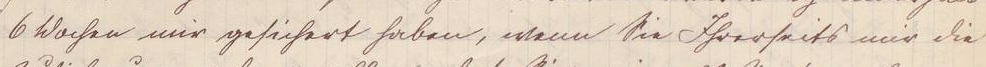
6 Wochen mir gesichert haben, wenn Sie Ihrerseits mir die
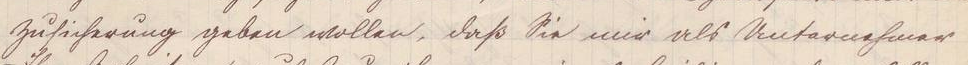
Zusicherung geben wollen, daß Sie mir als Unternehmer
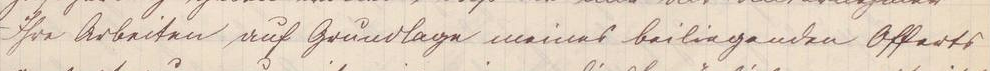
Ihre Arbeiten auf Grundlage meines beiliegenden Offerts
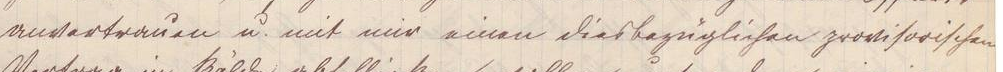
anvertrauen u. mit mir einen diesbezüglichen provisorischen
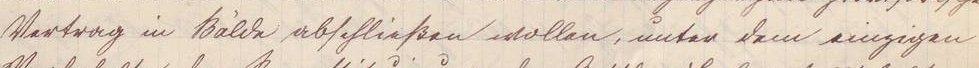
Vertrag in Bälde abschließen wollen, unter dem einzigen
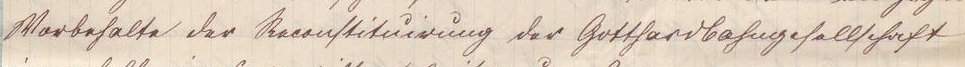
Vorbehalte der Reconstituirung der Gotthardbahngesellschaft
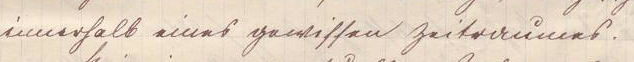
innerhalb eines gewissen Zeitraumes.
